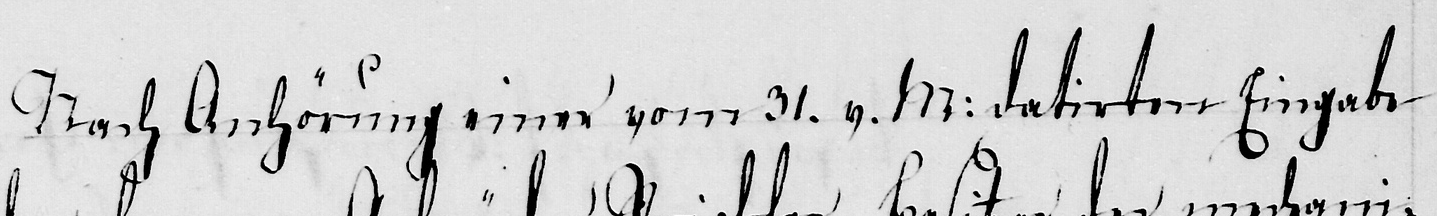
Nach Anhörung einer vom 31. v. M. datirten Eingabe
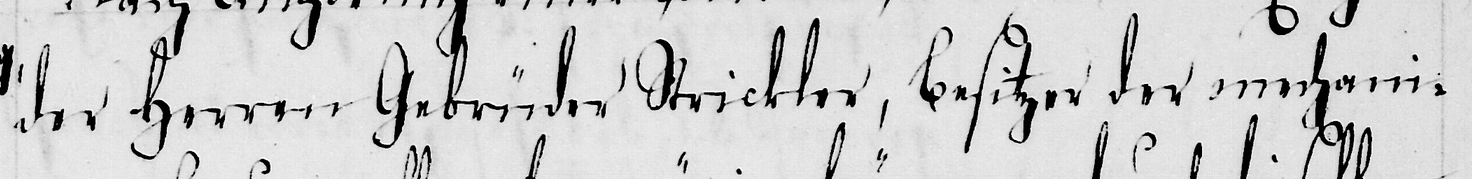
der Herren Gebrüder Strickler, Besitzer der mechani¬
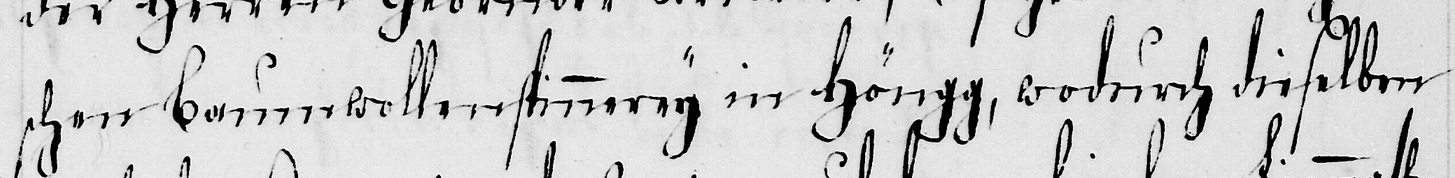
schen Baumwollenspinnerey in Höngg, wodurch dieselben
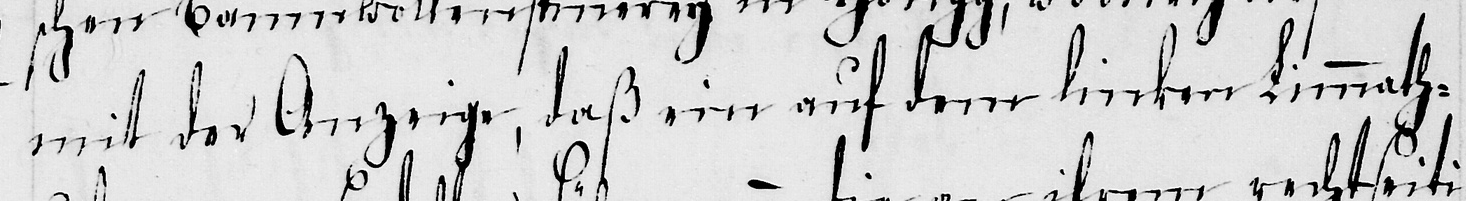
mit der Anzeige, daß ein auf dem linken Limmath¬
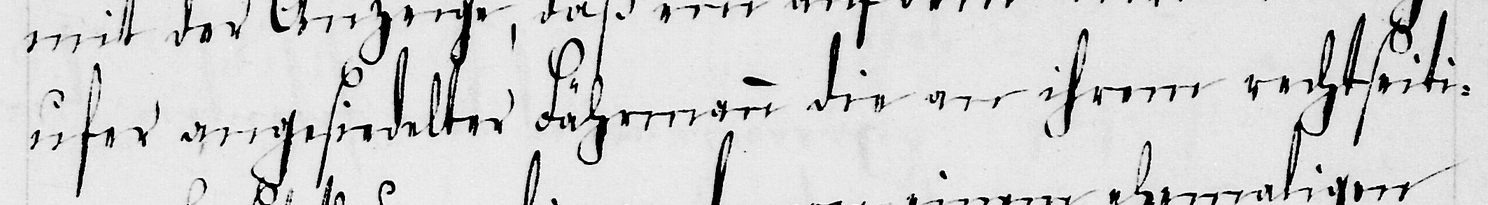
ufer angesiedelter Fährmann die an ihrem rechtseiti¬
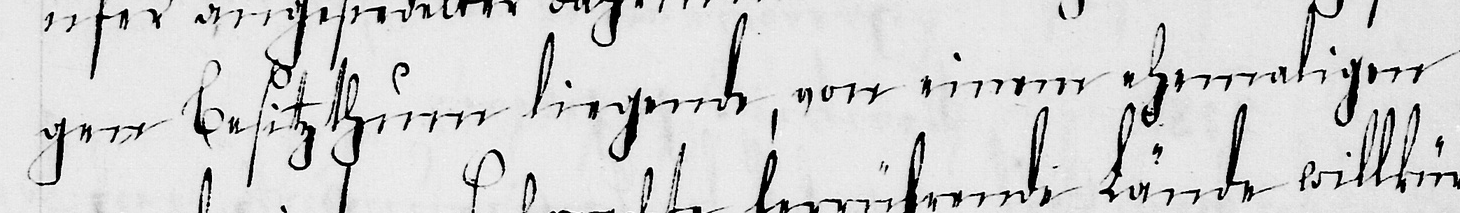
gen Besitzthum liegende, von einem ehemaligen
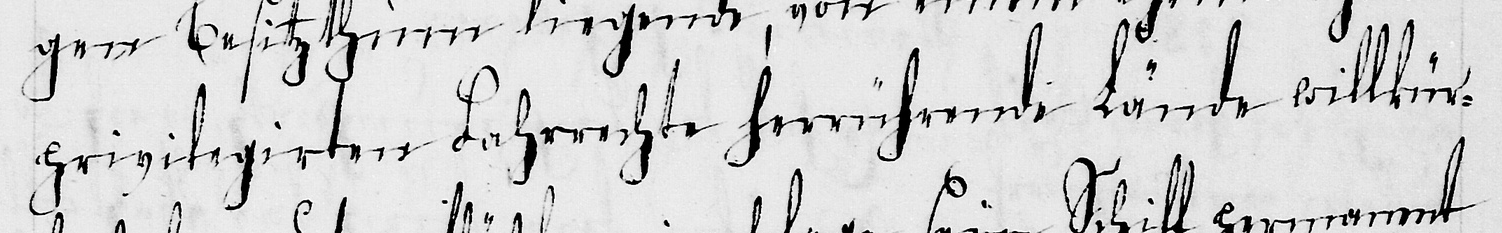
privilegirten Fahrrechte herrührende Lände willkür¬
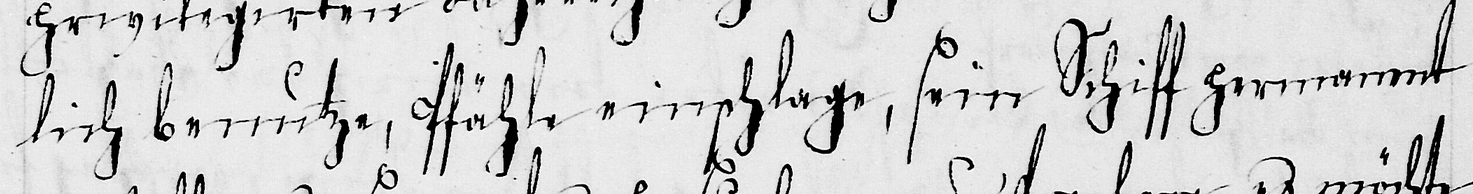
lich benutze, Pfähle einschlage, sein Schiff permanent
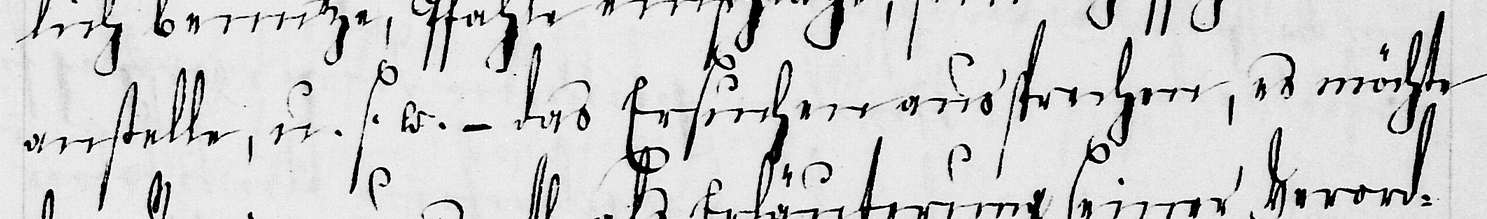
anstelle, u. s. w. – das Ersuchen aussprechen, es möchte
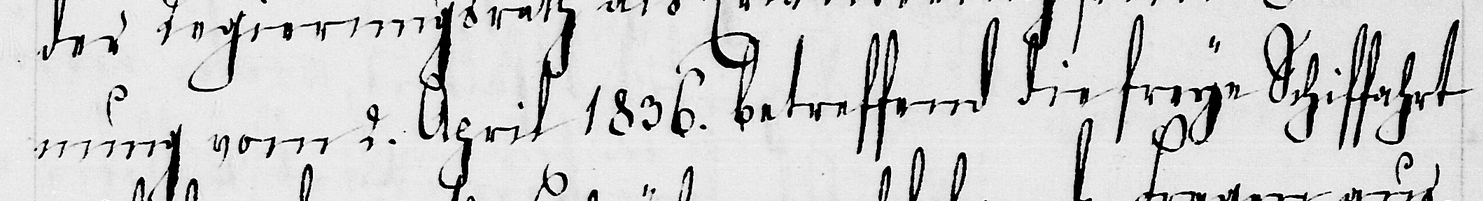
nung vom 2. April 1836. betreffend die freye Schiffahrt
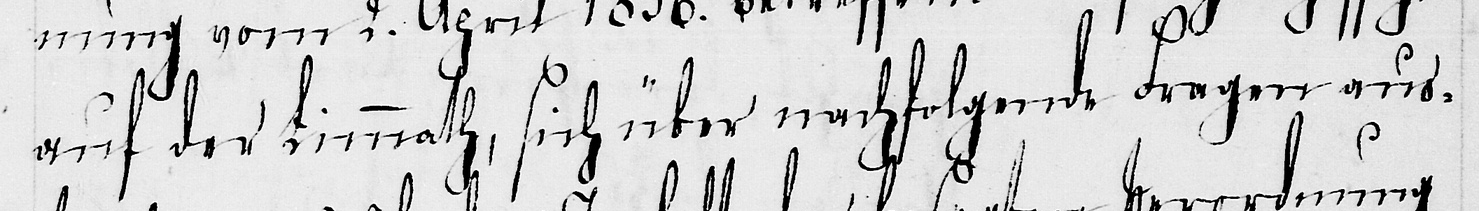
auf der Limmath, sich über nachfolgende Fragen aus¬
